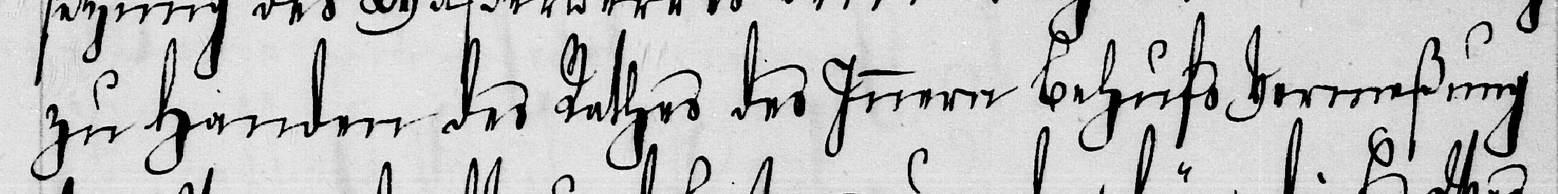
zu Handen des Rathes des Innern Behufs Vermeßung
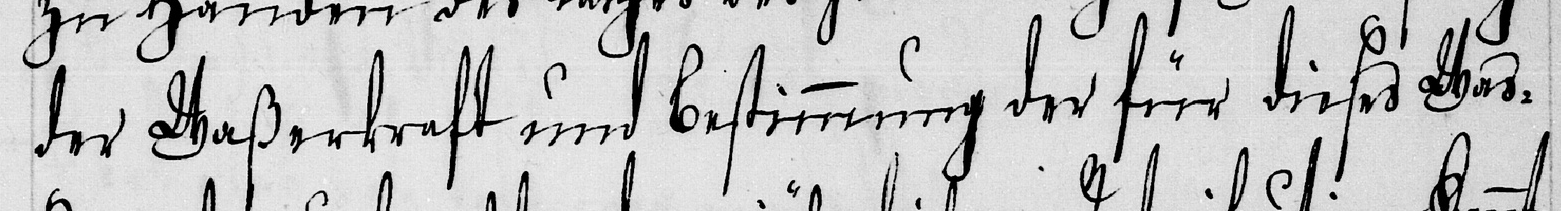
der Waßerkraft und Bestimmung der für dieses Wa¬
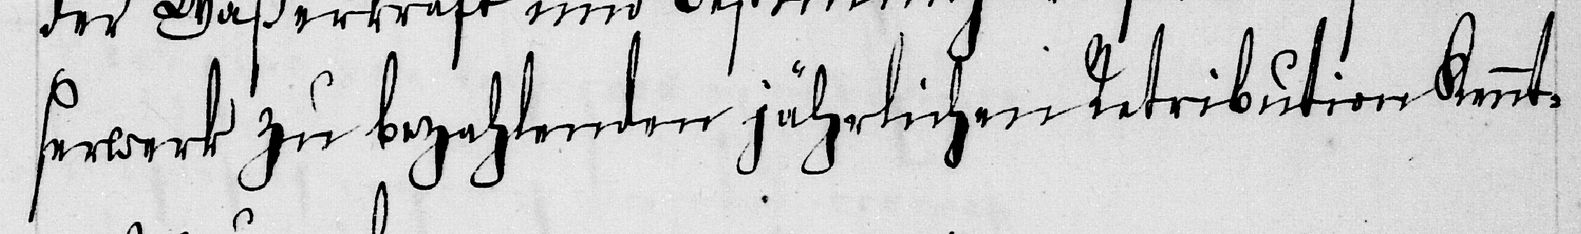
ßerwerk zu bezahlenden jährlichen Retribution Kennt¬
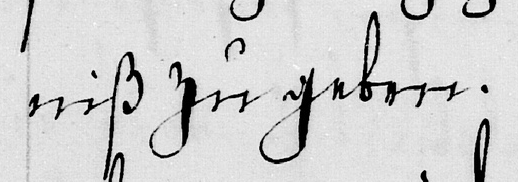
niß zu geben.
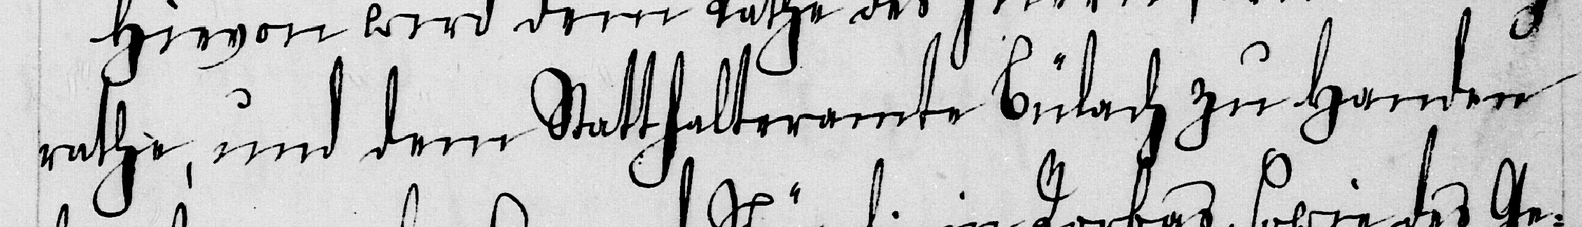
rathe, und dem Statthalteramte Bülach zu Handen
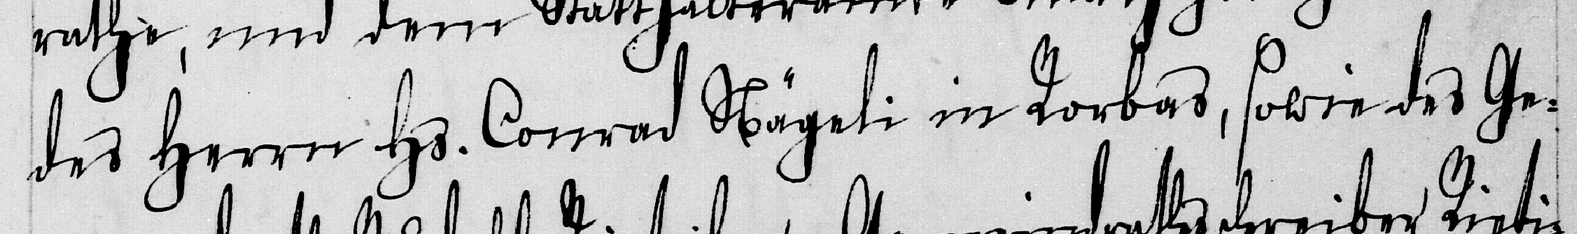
des Herrn Hs. Conrad Nägeli in Rorbas, sowie des Ge¬
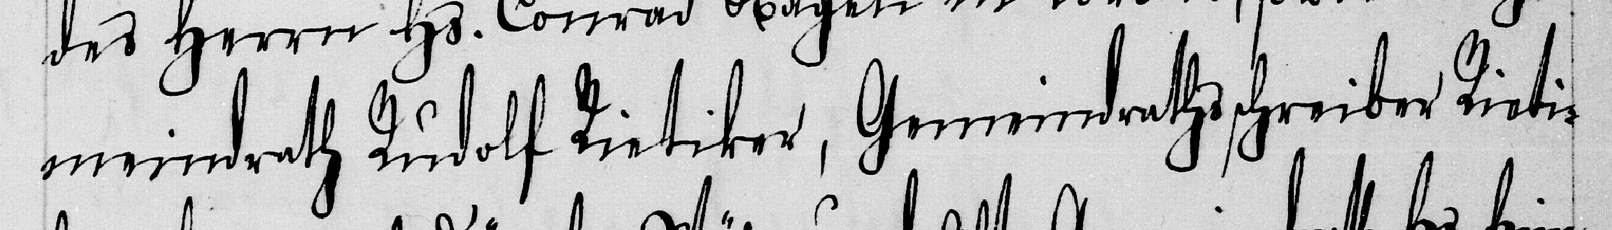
meindrath Rudolf Rietiker, Gemeindrathsschreiber Riet¬
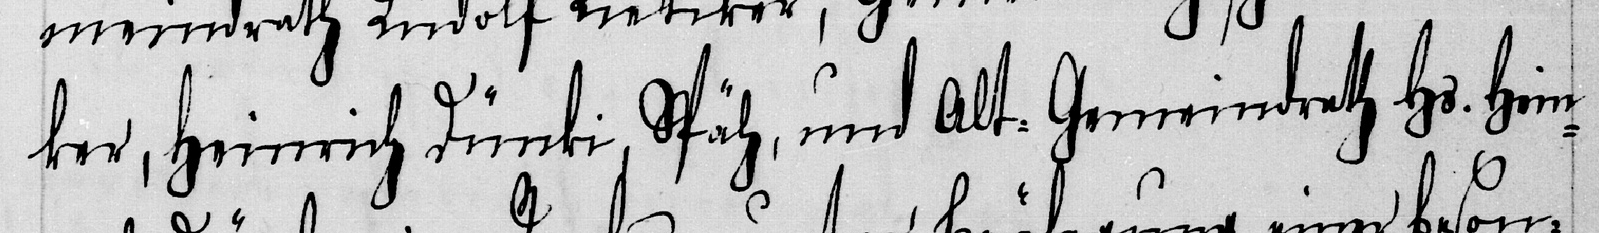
iker, Heinrich Dünki, Späh, und Alt-Gemeindrath Hs. Hein¬
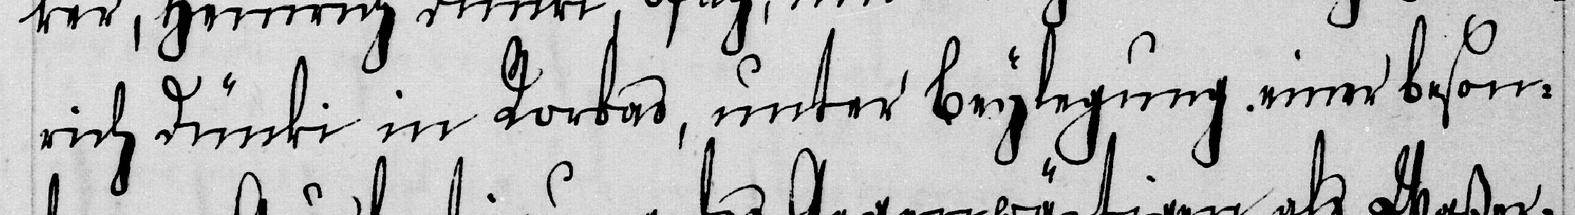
rich Dünki in Rorbas, unter Beylegung einer beson¬
